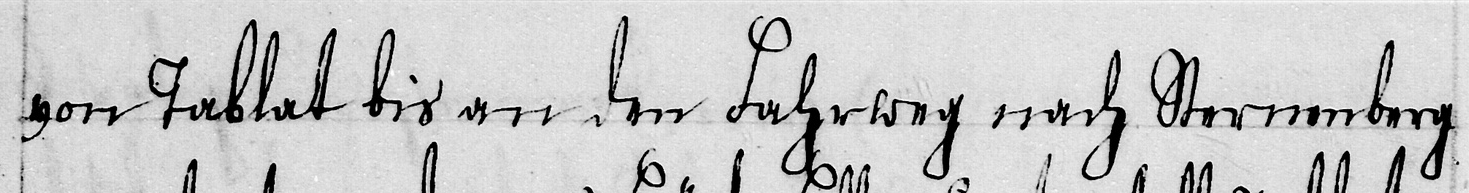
von Tablat bis an den Fahrweg nach Sternenberg
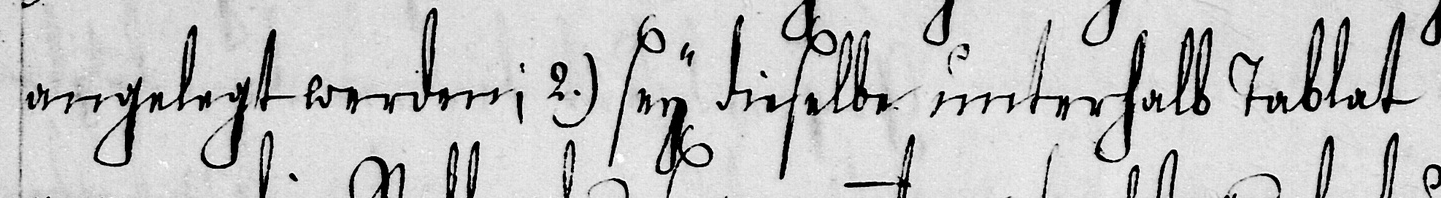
angelegt werden; 2.) sey dieselbe unterhalb Tablat
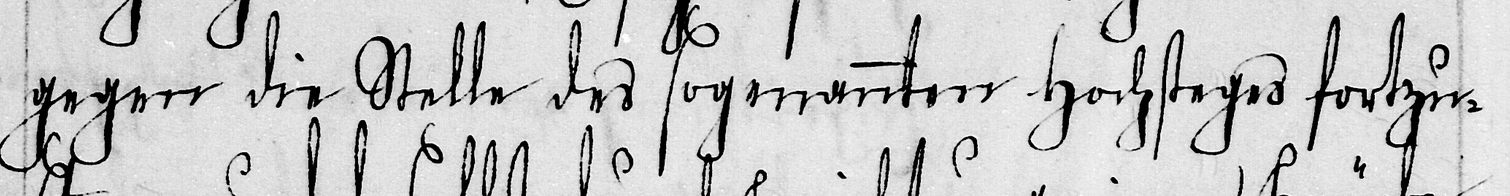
gegen die Stelle des sogenannten Hochsteges fortzus¬
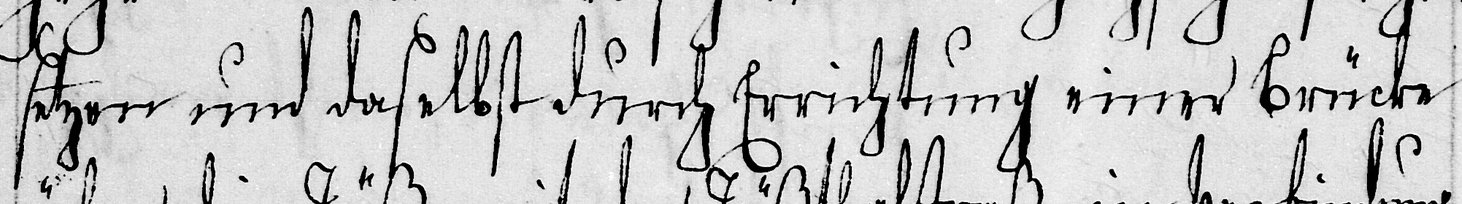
etzen und daselbst durch Errichtung einer Brücke
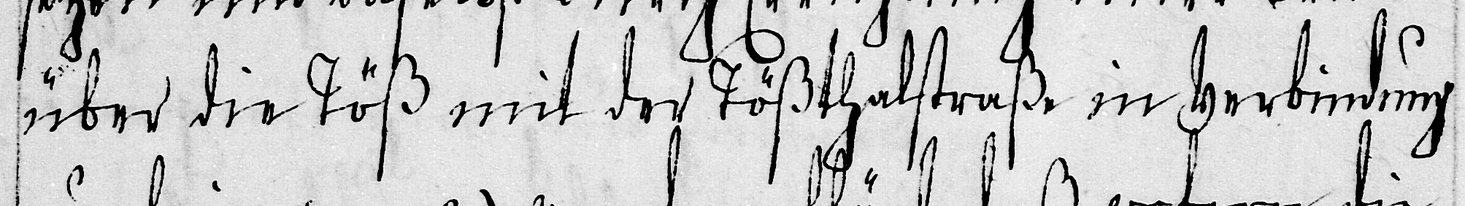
über die Töß mit der Tößthalstraße in Verbindung
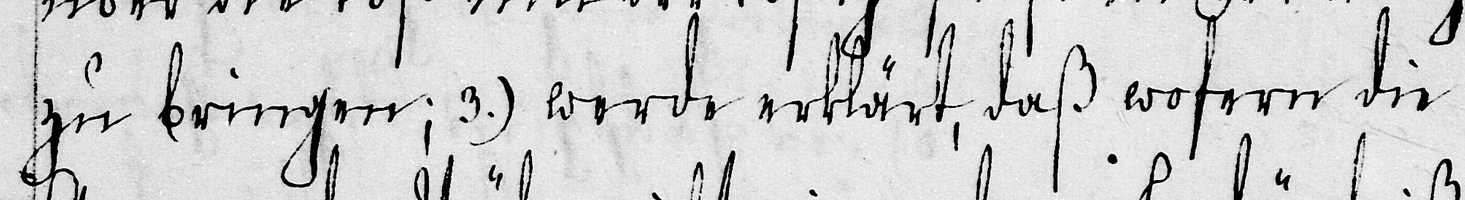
zu bringen; 3.) werde erklärt, daß wofern die
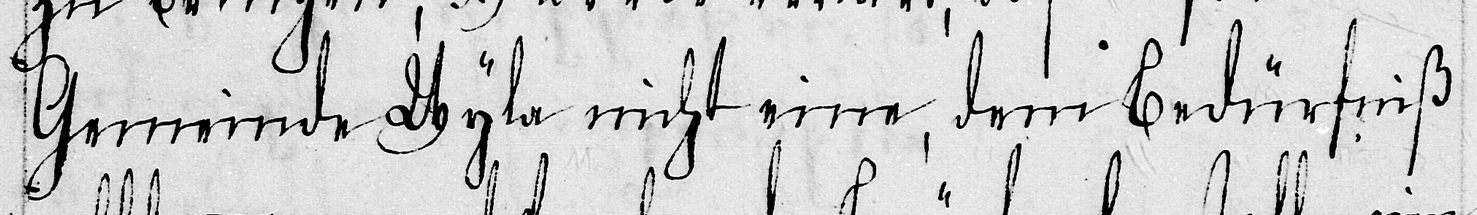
Gemeinde Wyla nicht eine, dem Bedürfniß
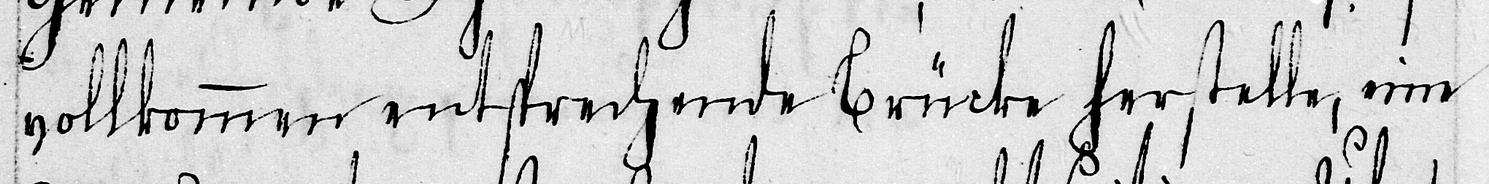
vollkommen entsprechende Brücke herstelle, eine
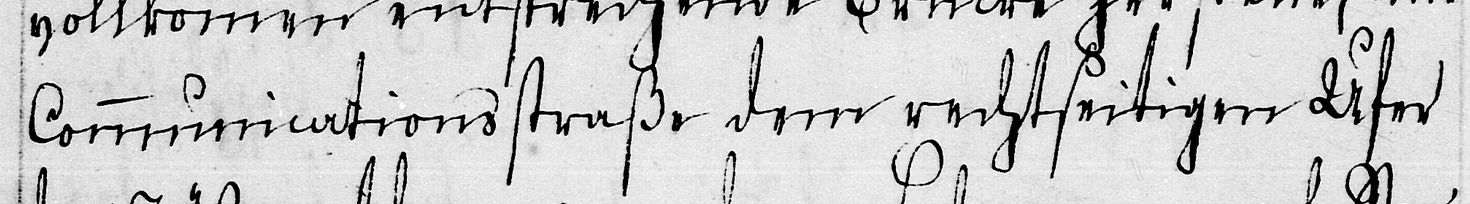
Communicationsstraße dem rechtseitigen Ufer
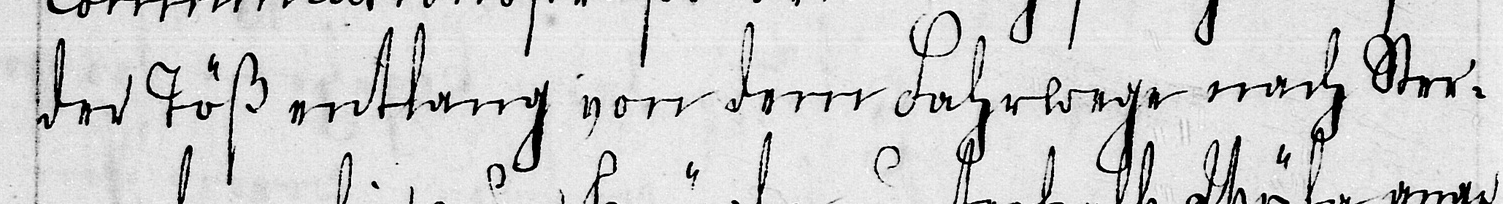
der Töß entlang von dem Fahrwege nach Ster¬
